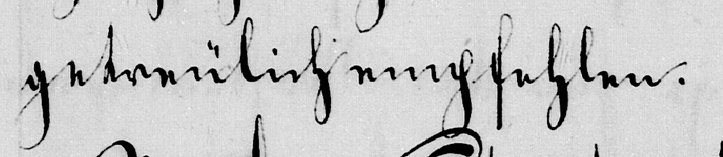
getreulich empfehlen.
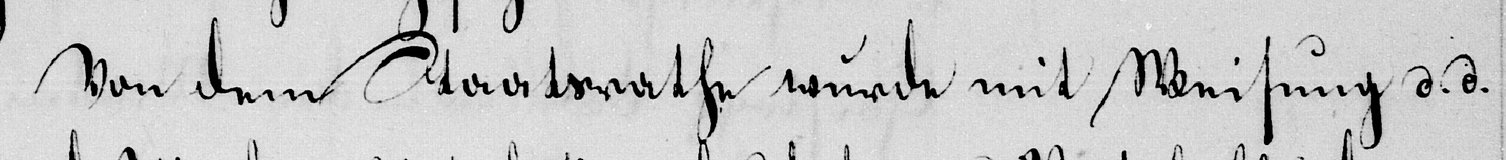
Von dem Staatsrathe wurde mit Weisung d. d.
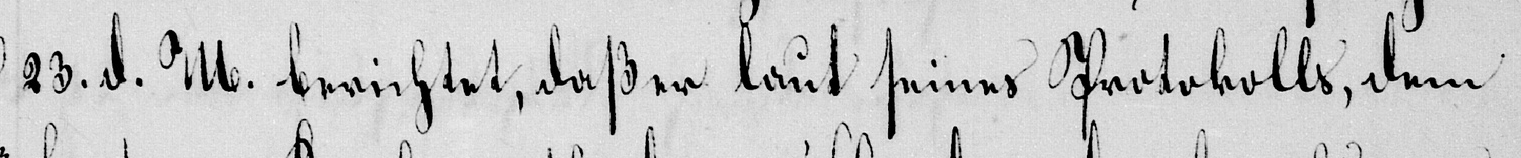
23. d. M. berichtet, daß er laut seines Protokolls, dem
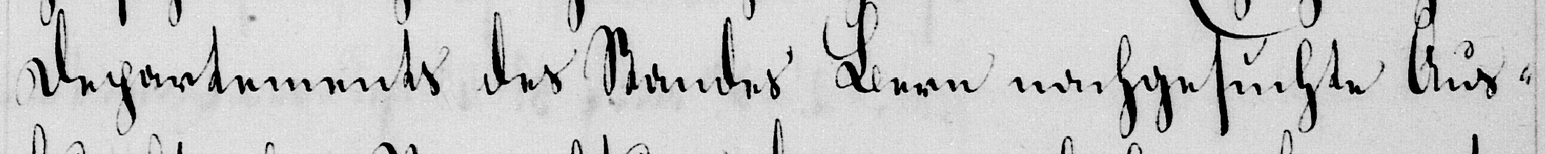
epartements des Standes Bern nachgesuchte Aus¬
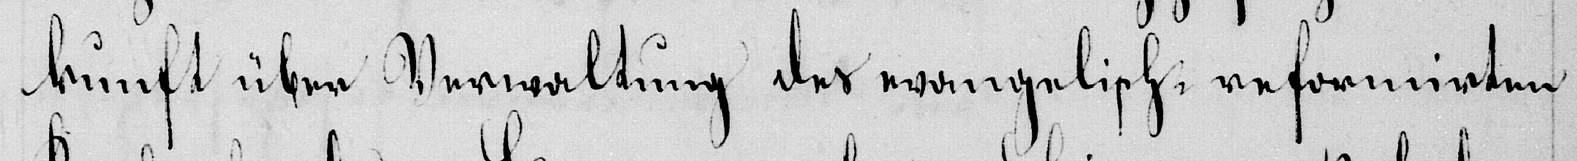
kunft über Verwaltung des evangelisch-reformirten
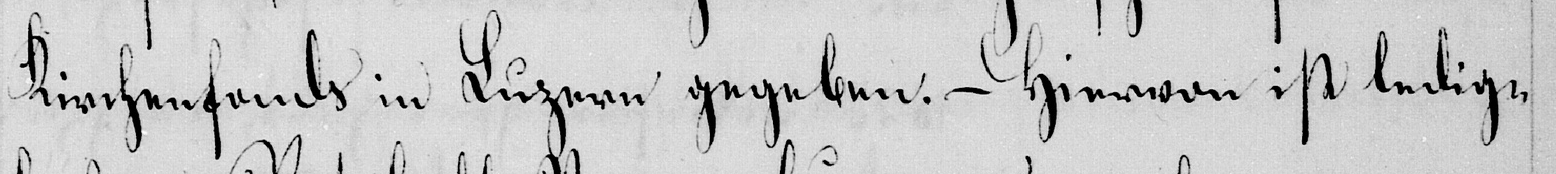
Kirchenfonds in Luzern gegeben. – Hiervon ist ledig¬
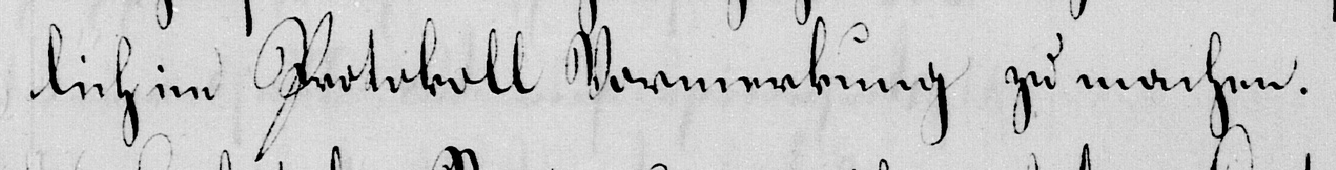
lich im Protokoll Vormerkung zu machen.
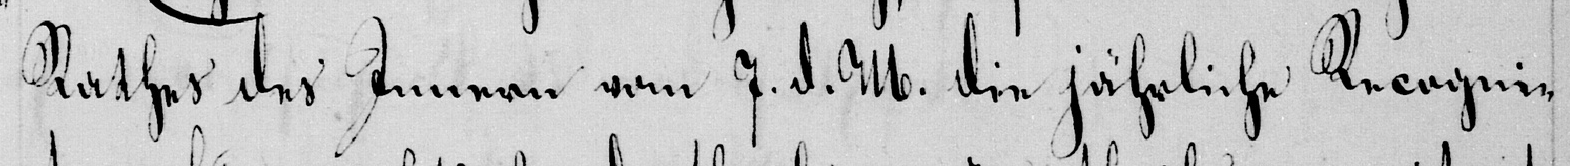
Rathes des Innern vom 7. d. M. die jährliche Recogni¬
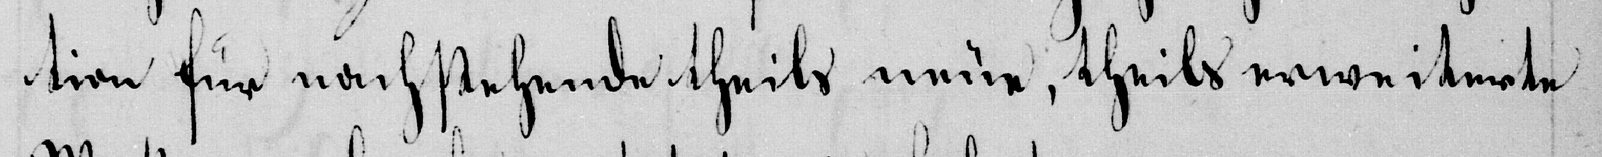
tion für nachstehende theils neue, theils erweiterte
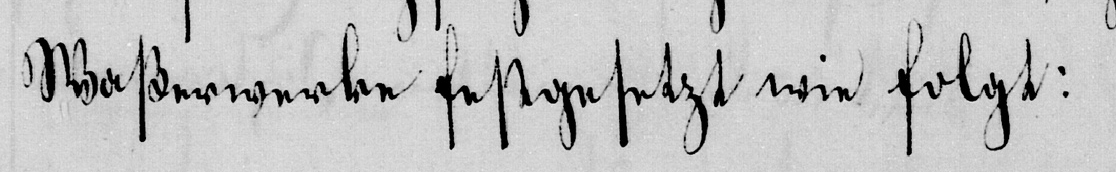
Waßerwerke festgesetzt wie folgt:
